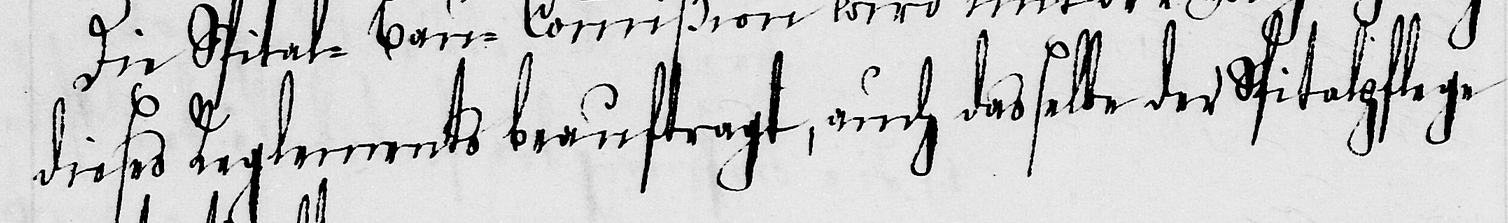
dieses Reglements beauftragt, auch dasselbe der
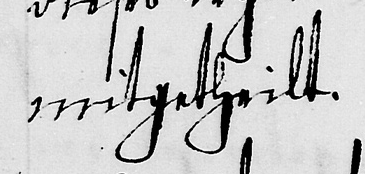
mitgetheilt.
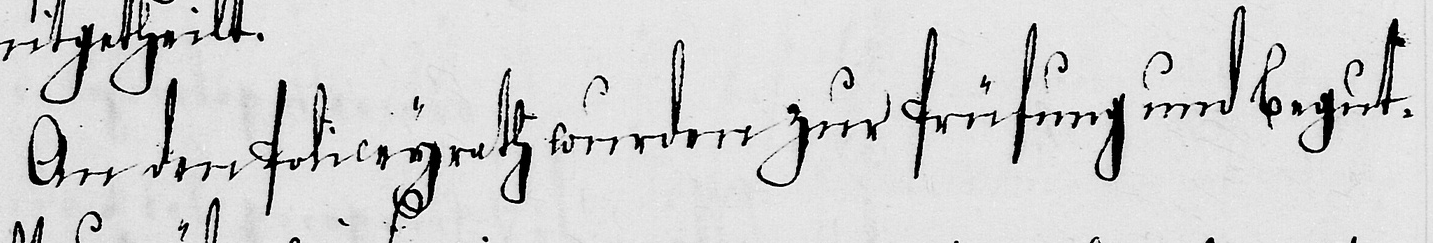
An den Policeyrath wurden zur Prüfung und Begut¬
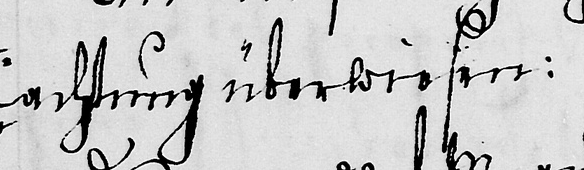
achtung überwiesen:
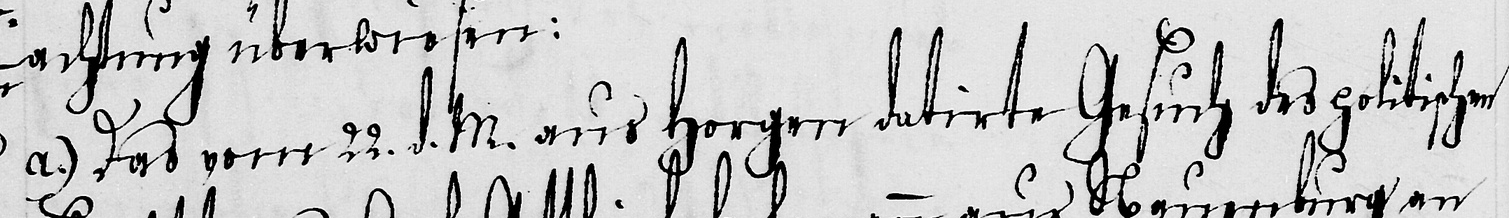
a.) Das vom 22. d. M. aus Horgen datirte Gesuch des politi¬
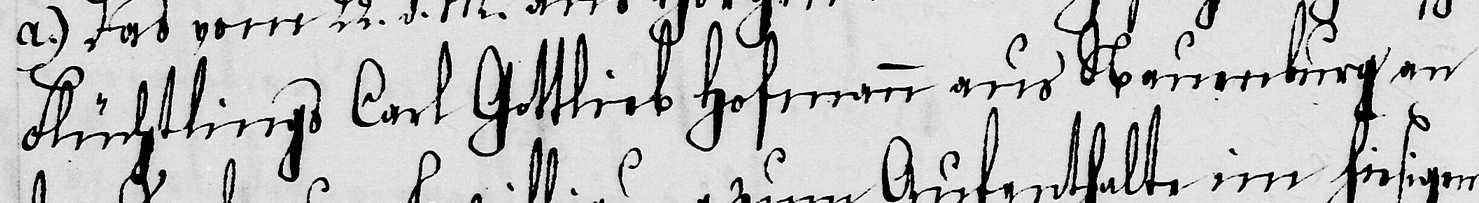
Flüchtlings Carl Gottlieb Hofmann aus Hauenburg an
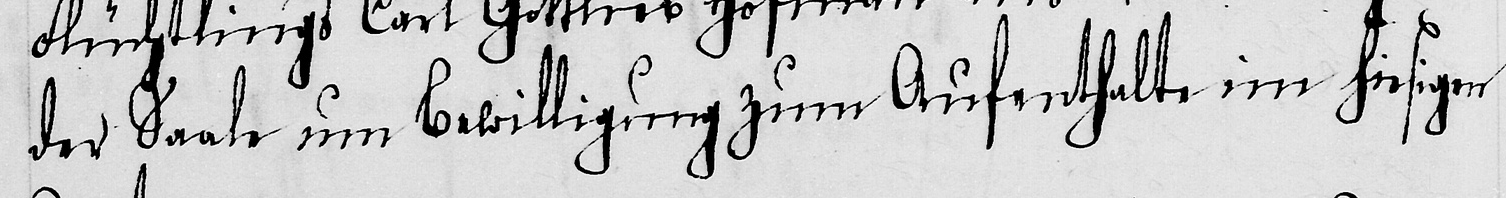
der Saale um Bewilligung zum Aufenthalte im hiesigen
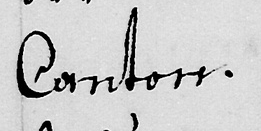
Canton.
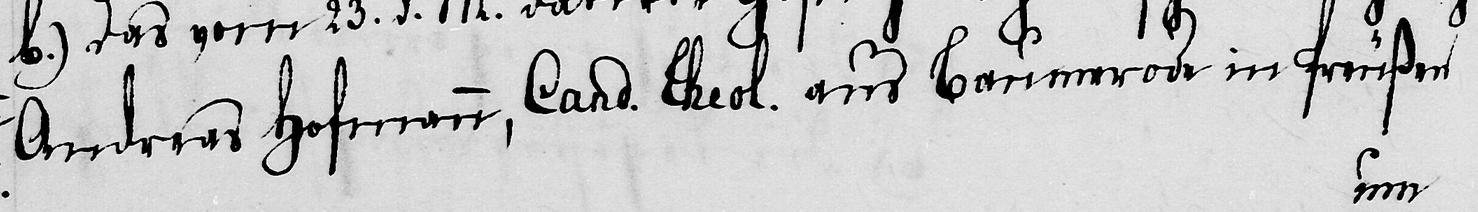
Andreas Hofmann, Cand. Theol. aus Baumerode in Preußen
